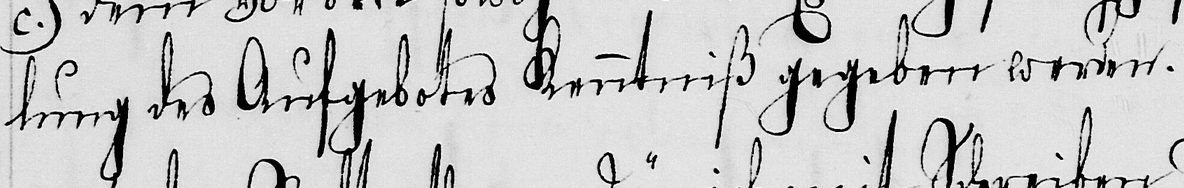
lung des Aufgebotes Kenntniß gegeben werden.
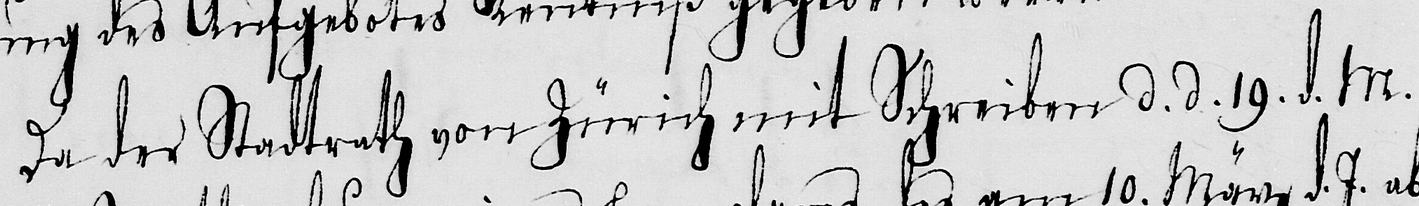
Da der Stadtrath von Zürich mit Schreiben d. d. 19. d. M.
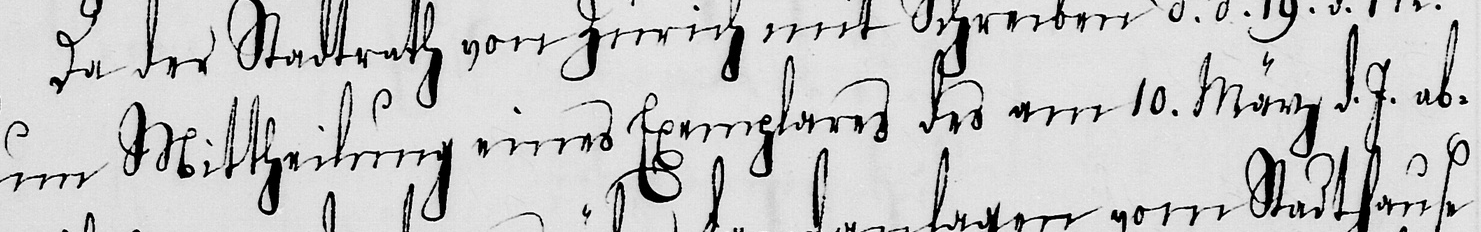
um Mittheilung eines Exemplares des am 10. März d. J. ab¬
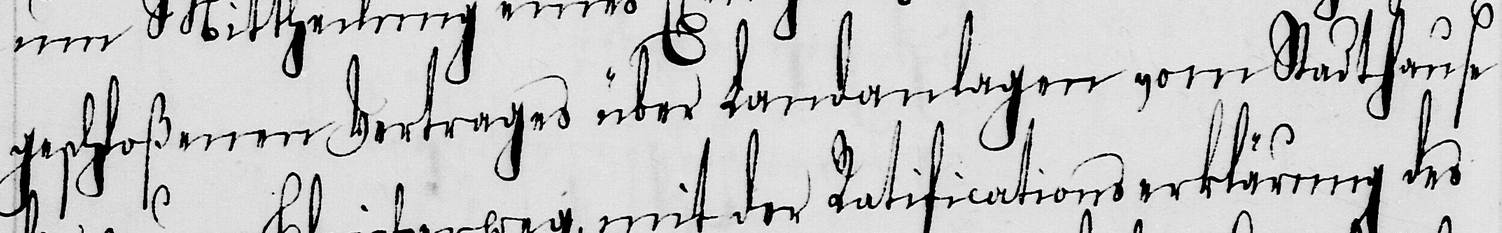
geschloßenen Vertrages über Landanlagen vom Stadthause
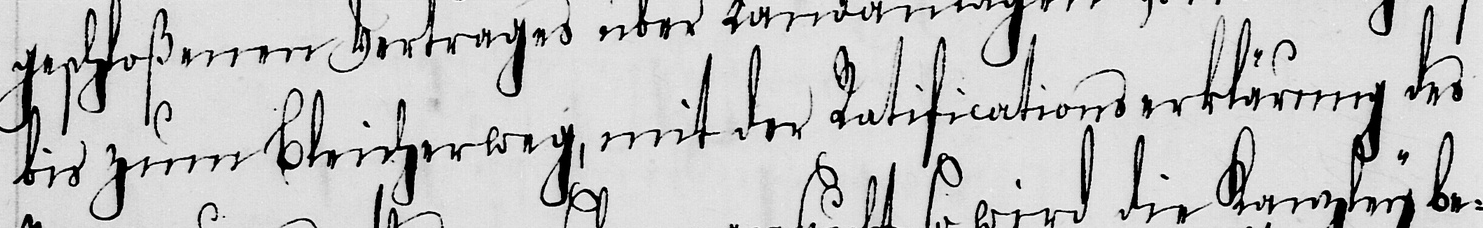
bis zum Bleicherweg, mit der Ratificationserklärung des
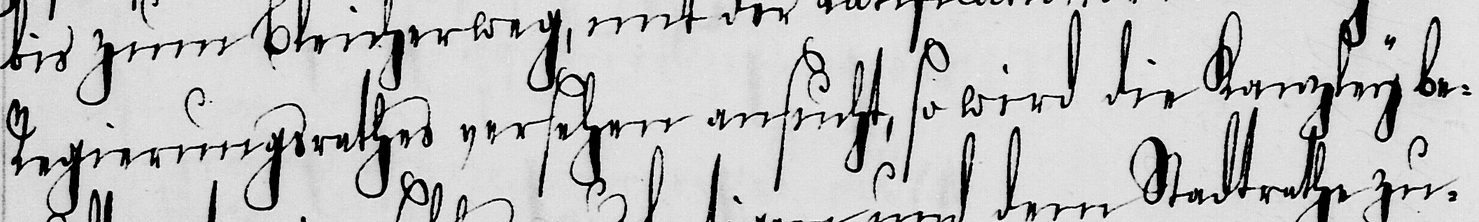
Regierungsrathes versehen ansucht, so wird die Kanzley be¬
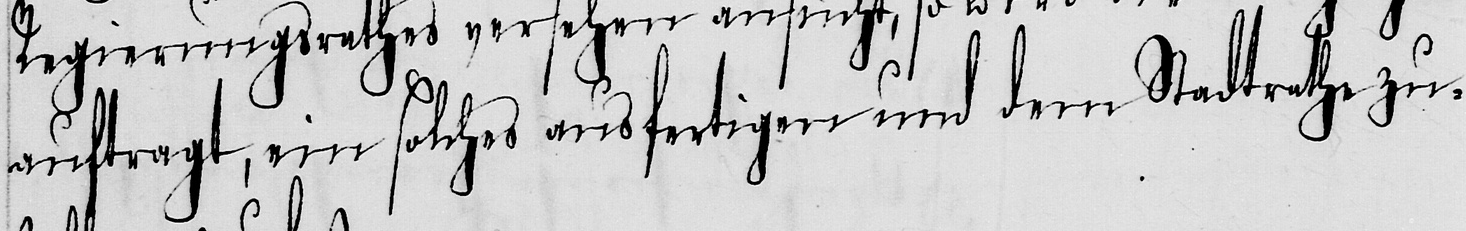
auftragt, ein solches ausfertigen und dem Stadtrathe zu¬
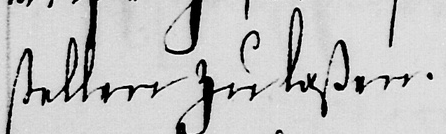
stellen zu laßen.
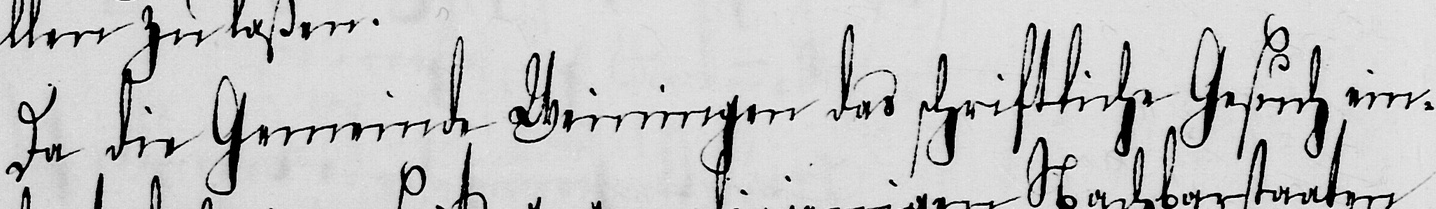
Da die Gemeinde Weiningen das schriftliche Gesuch ei¬
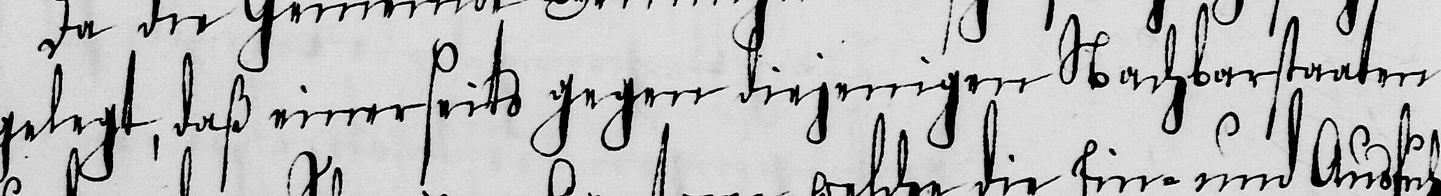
gelegt, daß einerseits gegen diejenigen Nachbarstaaten
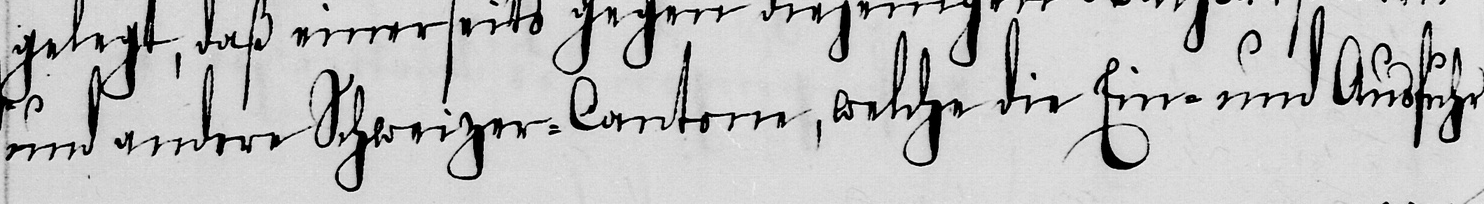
und andere Schweizer-Cantone, welche die Ein- und Ausfuhr
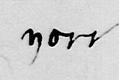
von
